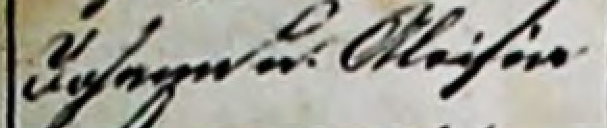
Johann u. Aloisia
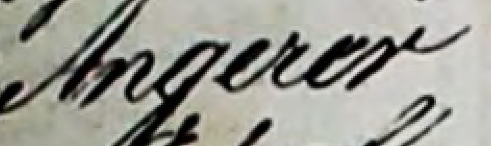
Angerer
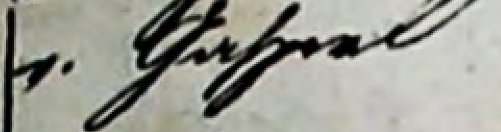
v. Gasperl
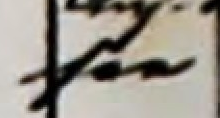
see
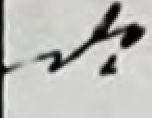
do
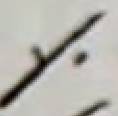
./.
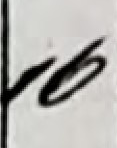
16
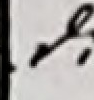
do
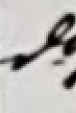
do
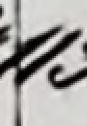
113
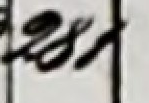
281
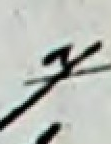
7
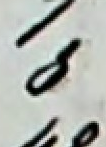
8
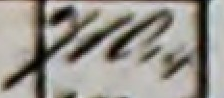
710,4
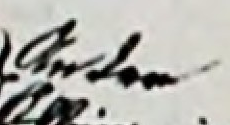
An der
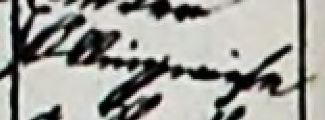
Allingwiese
